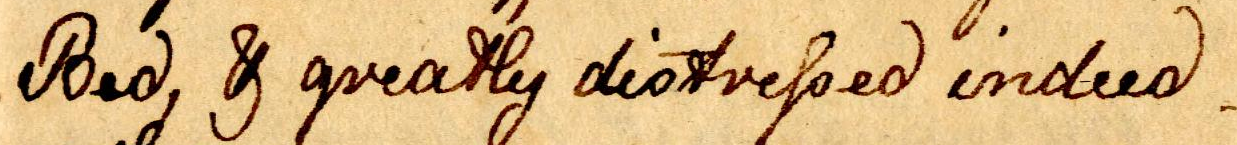Bed, & greatly distressed indeed
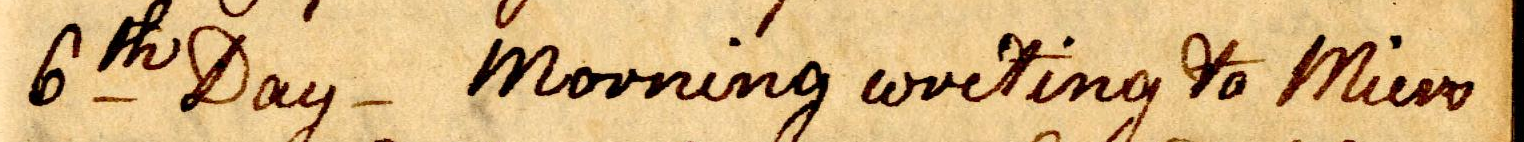6^th Day- Morning writing to Miers
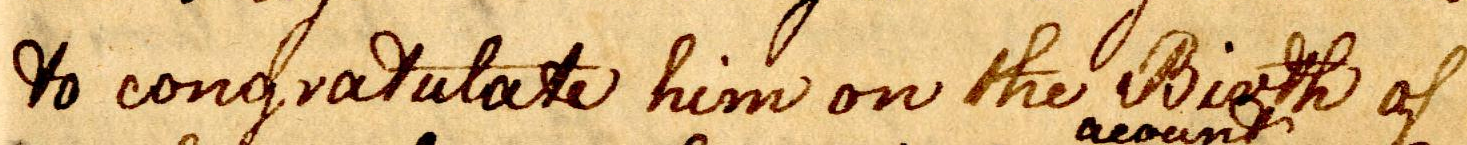to congratulate him on the Birth of
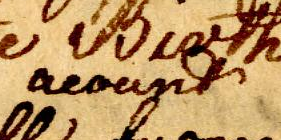acount
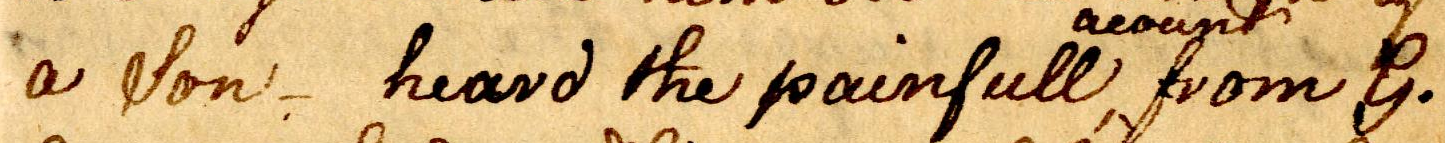a Son- heard the painfull from G.
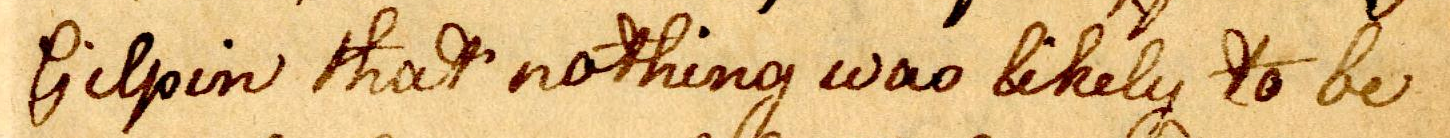Gilpin that nothing was likely to be
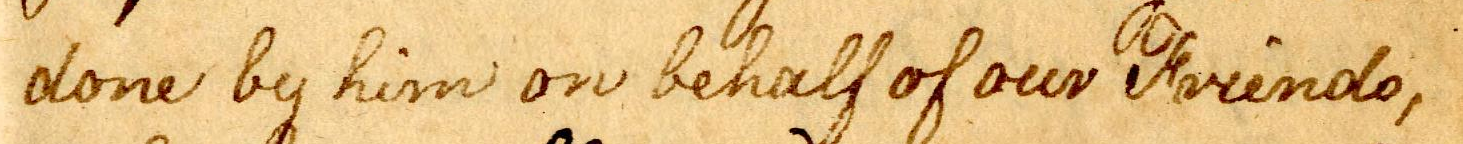done by him on behalf of our Friends,
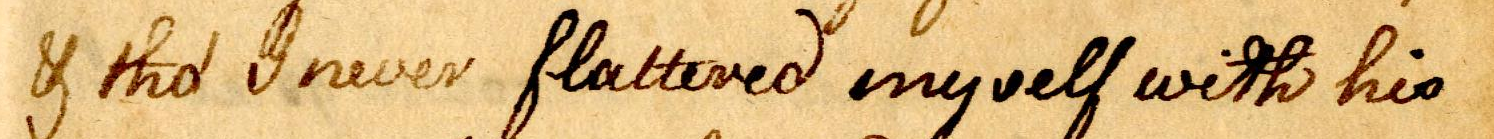& tho' I never flattered myself with his
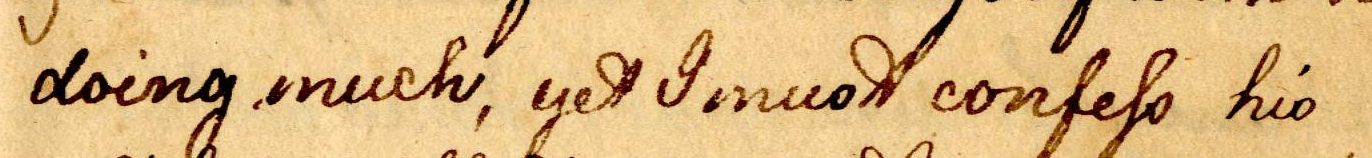doing much, yet I must confess his
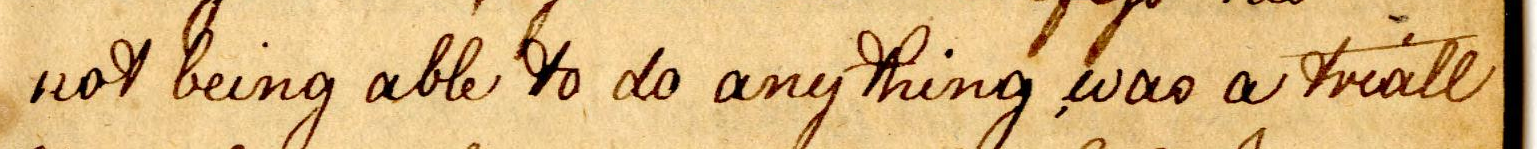not being able to do anything was a triall
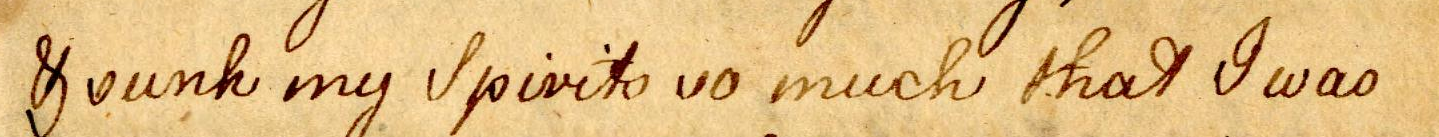& sunk my Spirits so much that I was
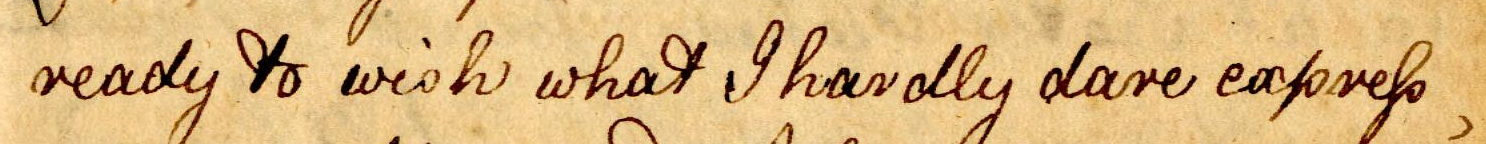ready to wish what I hardly dare express
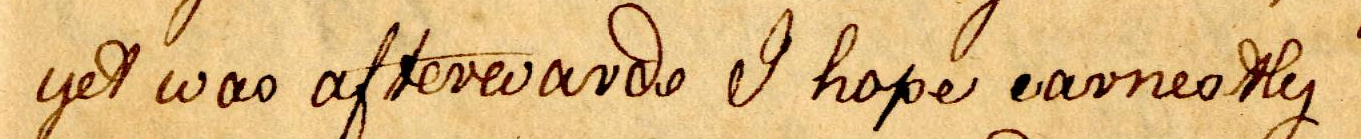yet was afterwards I hope earnestly
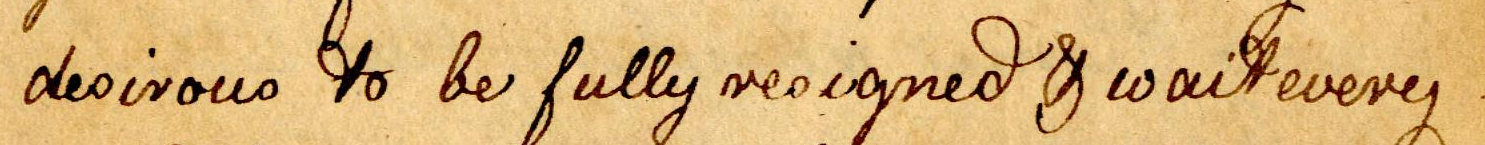desirous to be fully resigned & wait every
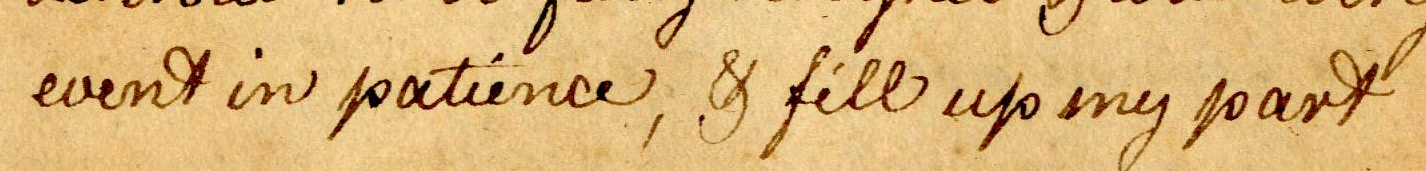event in patience, & fill up my part
